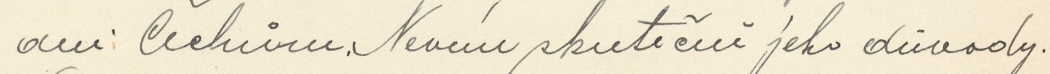ani Čechům. Nevím skutečně jeho důvody.
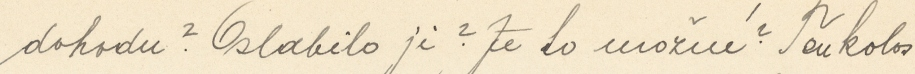dohodu? Oslabilo ji? Je to možné? Ten kolos
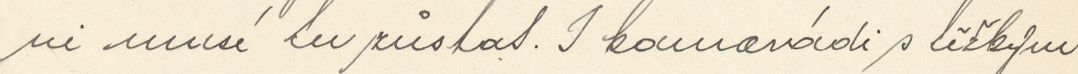ni musí tu zůstat. I kamarádi s těžkým
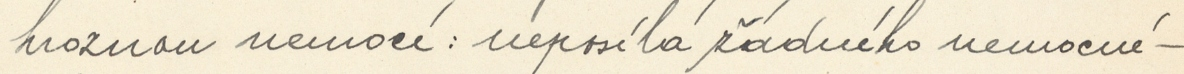hroznou nemocí: neposílá žádného nemocné-
